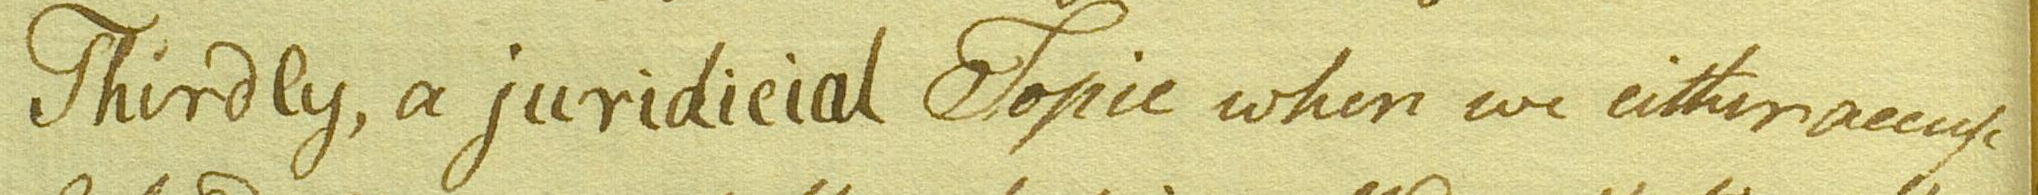Thirdly, a juridicial Topic when we either accuse
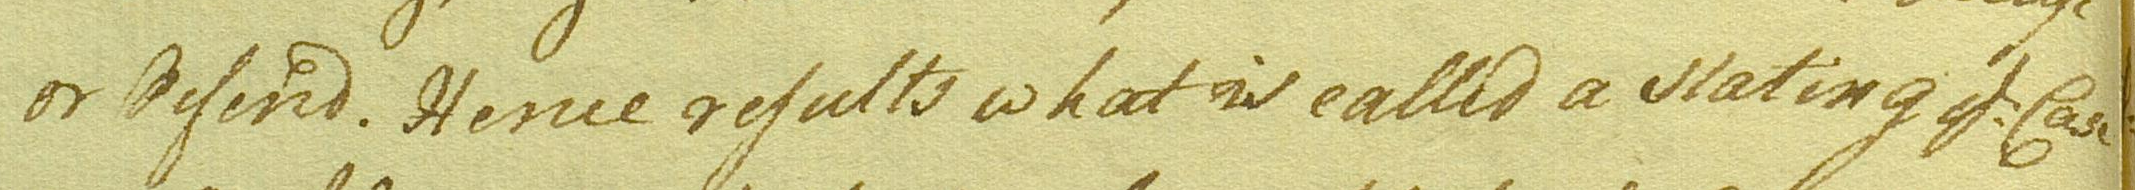or defend. Hence results what is called a stating y^e. Case
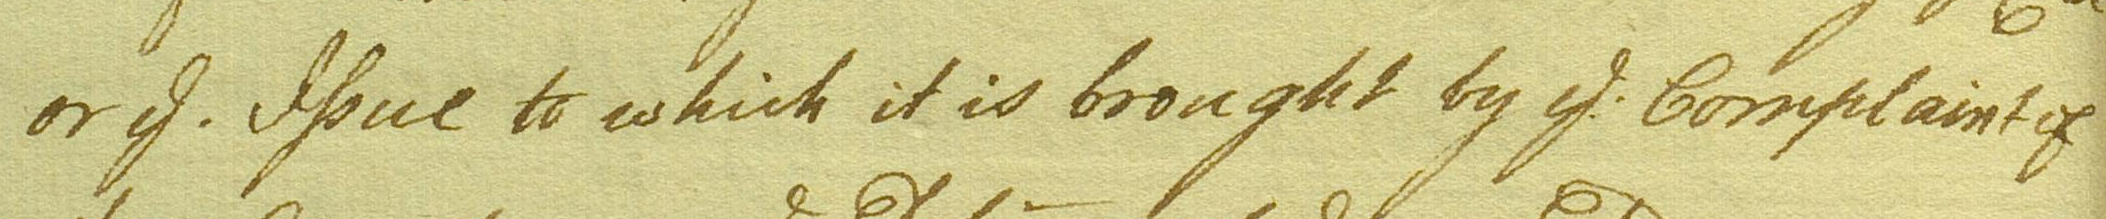or y^e. Issue to which it is brought by y^e: Complaint of
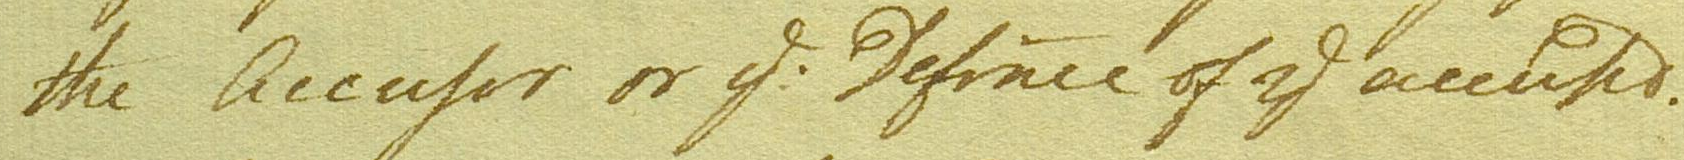the Accusor or y^e: Defence of ye accused.
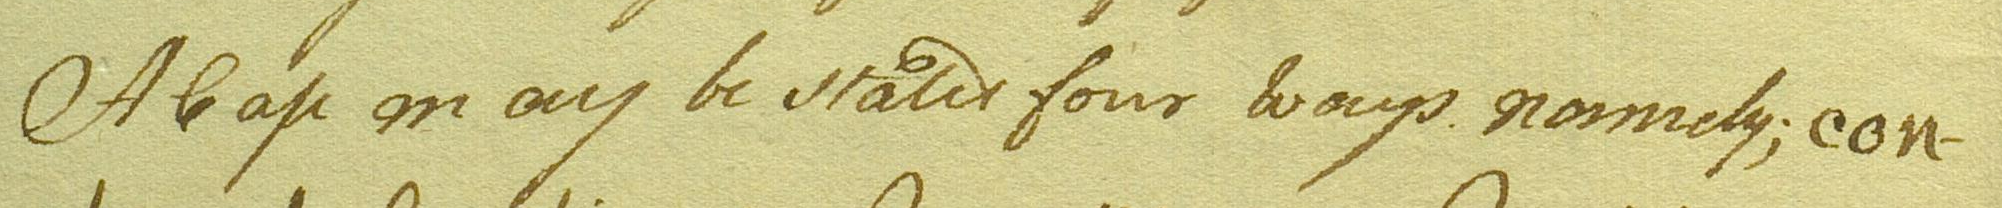A Case may be stated four ways namely; con-
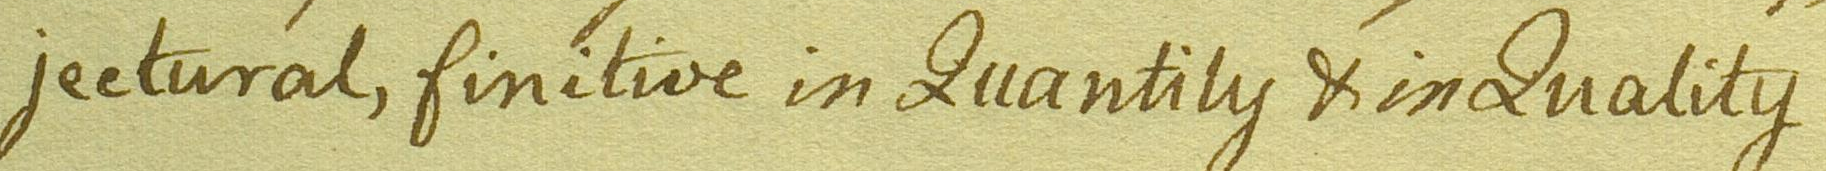jectural, finitive in Quantity & in Quality.
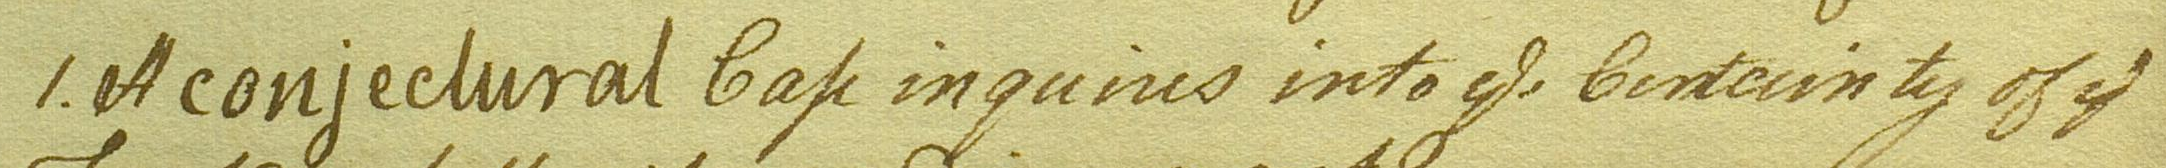1. A conjectural Case inquires into y^e Certainty of y^e
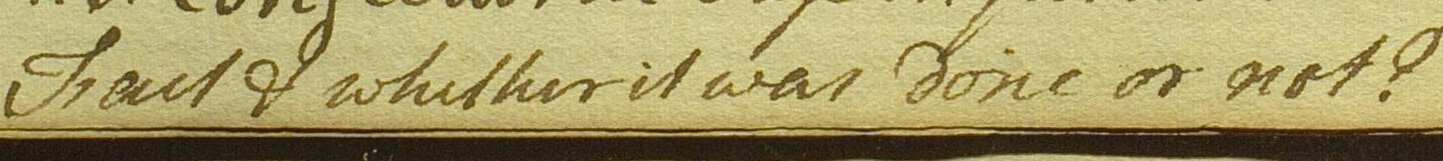Fact & whither it was done or not.
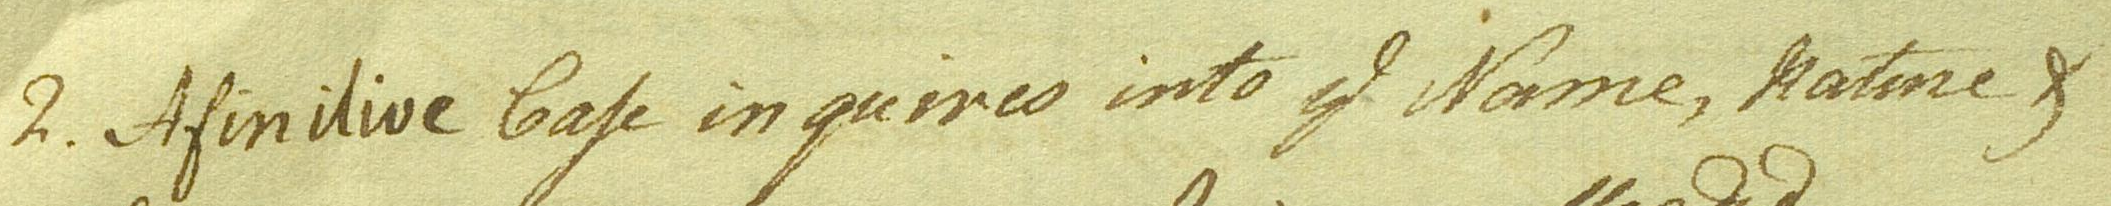2. A finitive Case inquires into y^e Name, Nature &
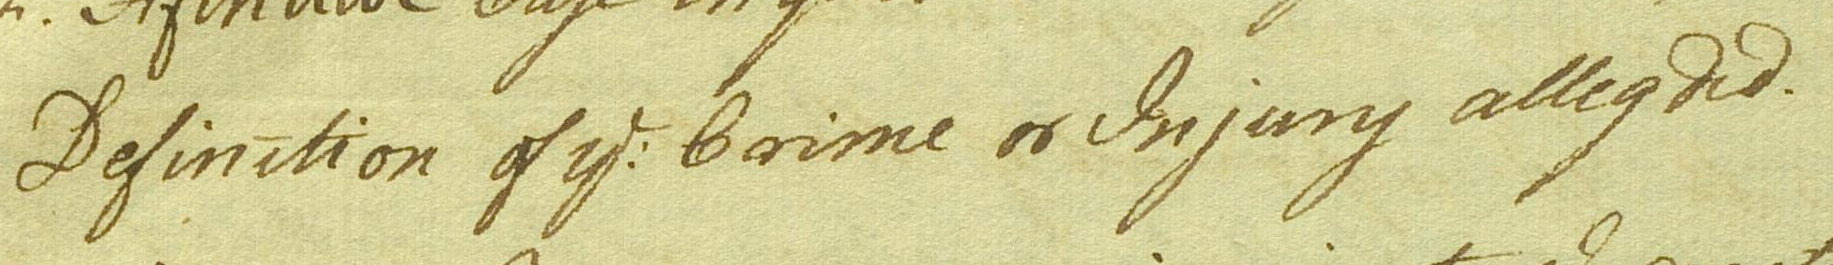Definition of y^e: Crime or Injury allegded.
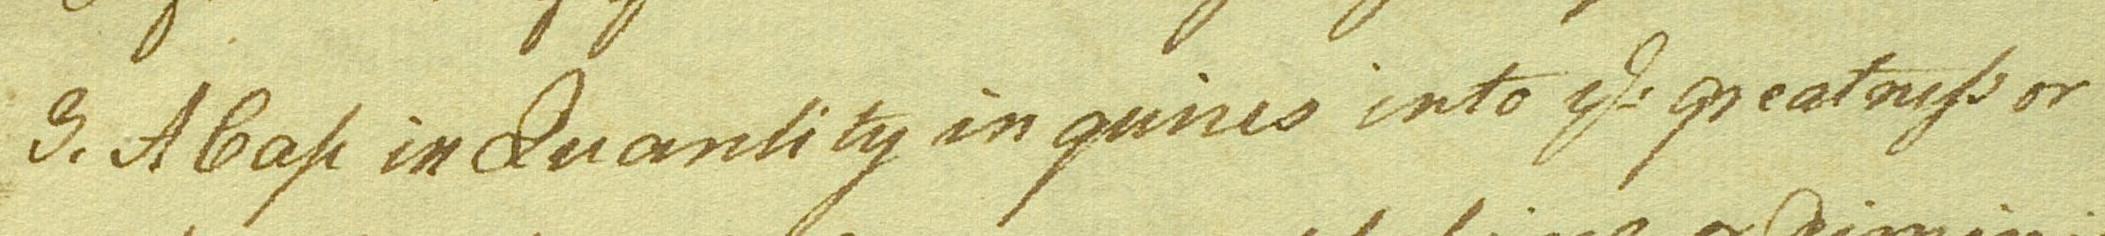3. A Case in Quantity inquires into y^e greatness or
